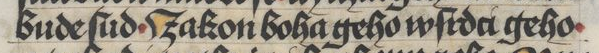bude ſud.Zakon boha geho wſrdci geho.
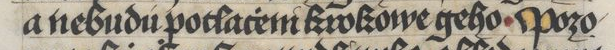a nebudu potlaċeni krokowe geho.Pozo¬
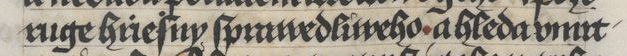ruge hṙieẛny ſprawedliweho.a hleda vmrt¬
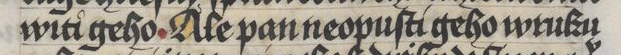witi geho.Ale pan neopuſtí geho wruku
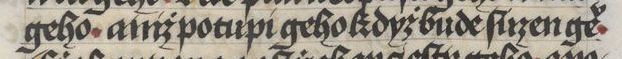geho.aníż potupí geho kdyż bude ſuzen gev
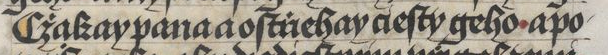Cżakay pana a oſtṙiehay cieſty geho.a po¬
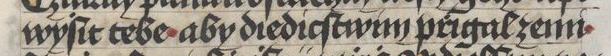wyẛit tebe.aby diedicſtwím pṙigal zemi.
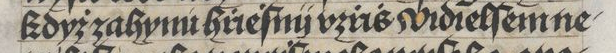kdyż zahynú hṙieẛnij vzṙiṡ Vidielſem ne¬
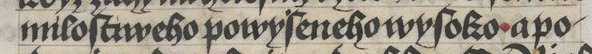miloſtiweho powyẛeneho wyſoko.a po¬
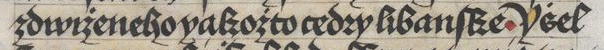zdwrżeneho yakożto cedry libanſke.Yṡel
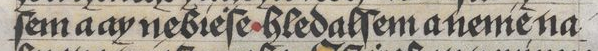ſem a ay nebíeẛe.hledalſen a neníe na¬
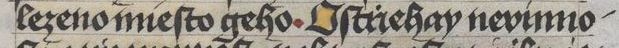lezeno míeſto geho.Oſtṙiehay nevinno¬
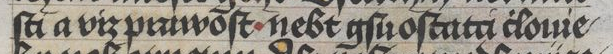ſti a viz prawoſt.nebt gſu oſtatci ċlouie¬
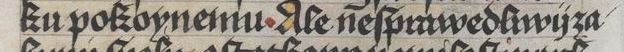ku pokoynemu.Ale neſprawedliwij za¬
